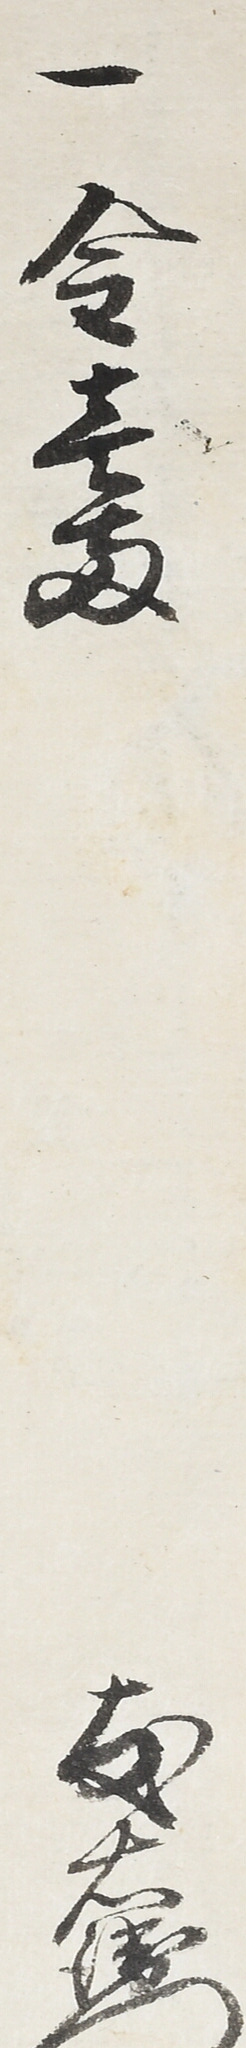一金壱両友右衛門
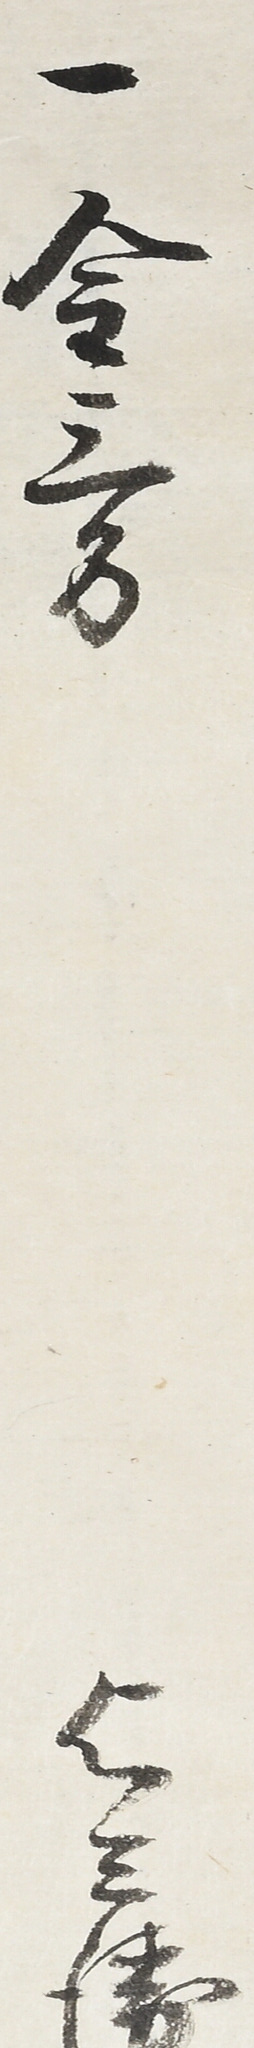一金三分与兵衛
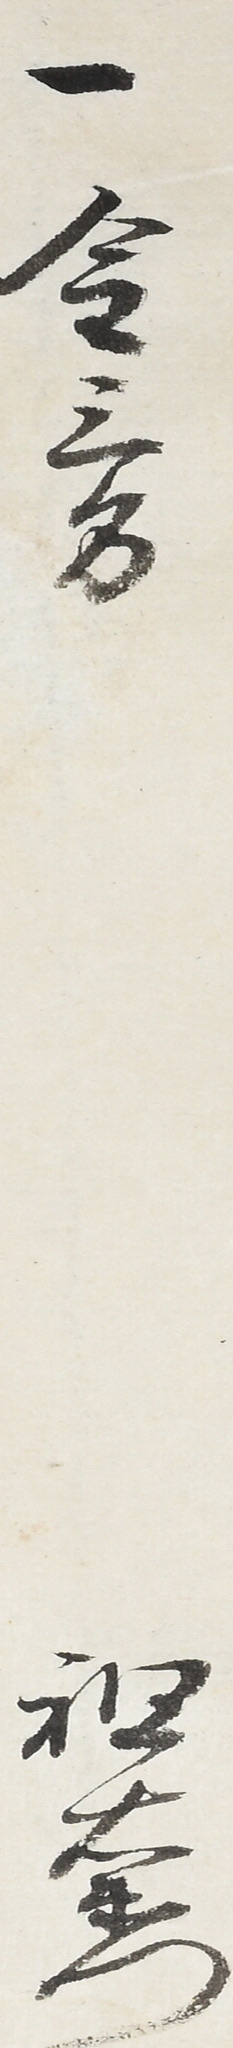一金三分祖右衛門

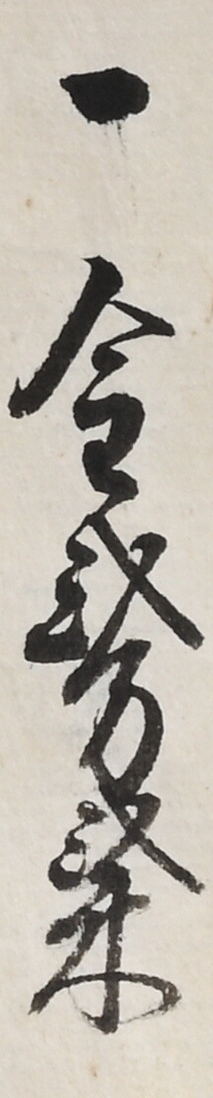一金弐分又蔵
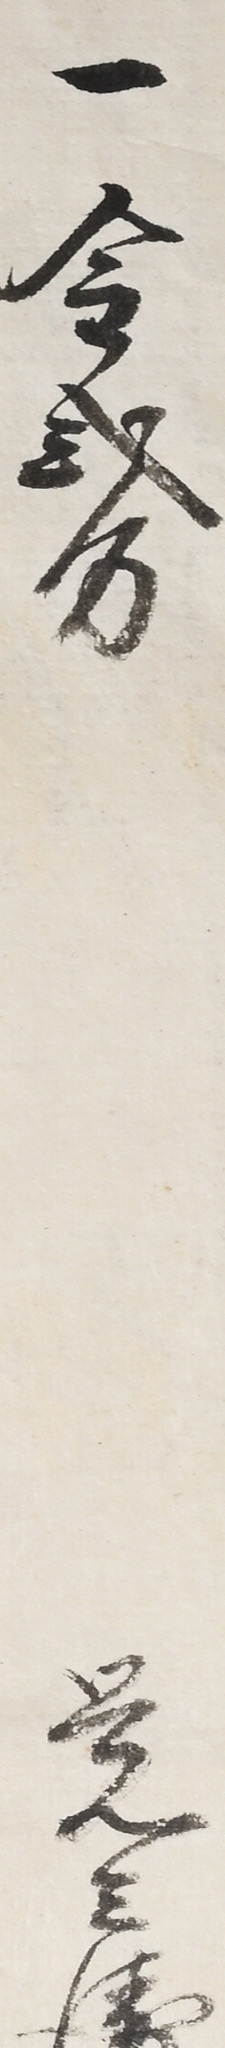一金弐分覚兵衛
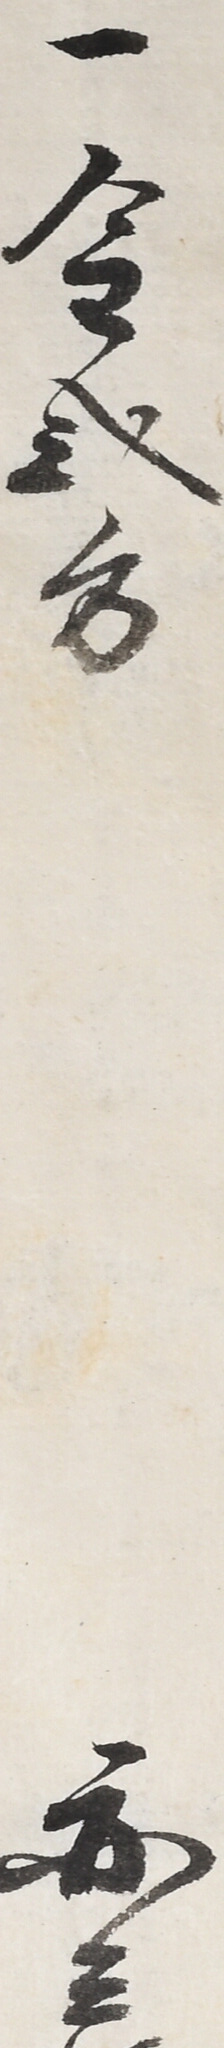一金弐分覚兵衛
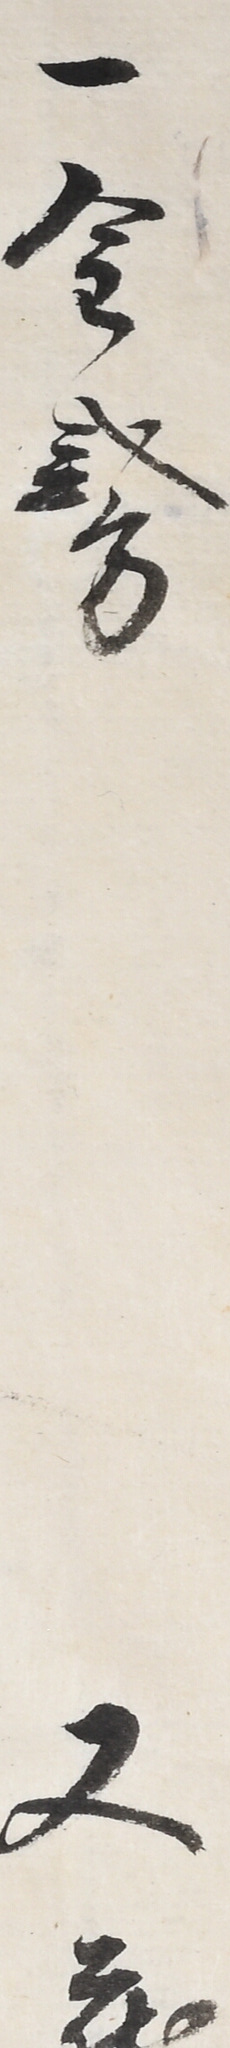一金弐分又蔵
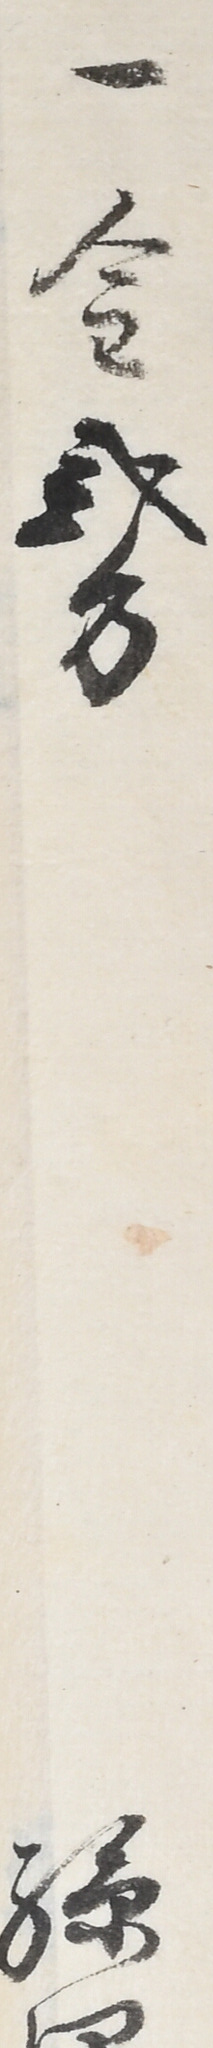一金弐分孫四郎
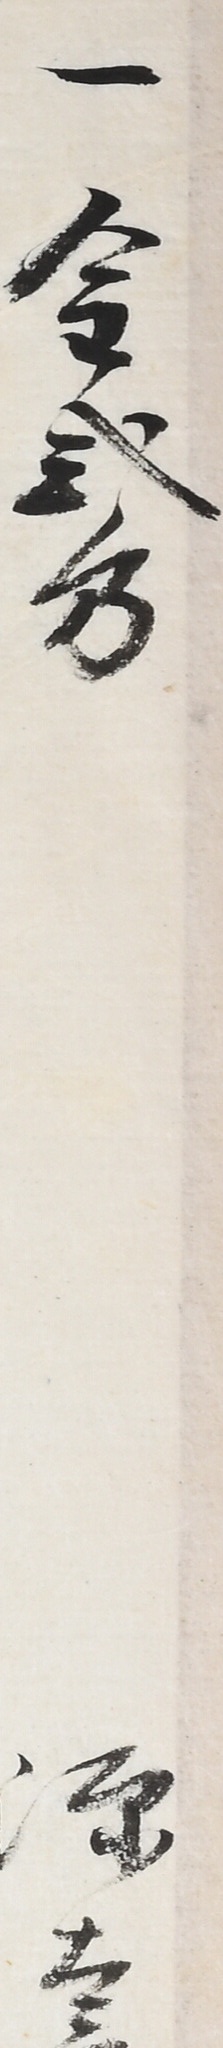一金弐分源太郎
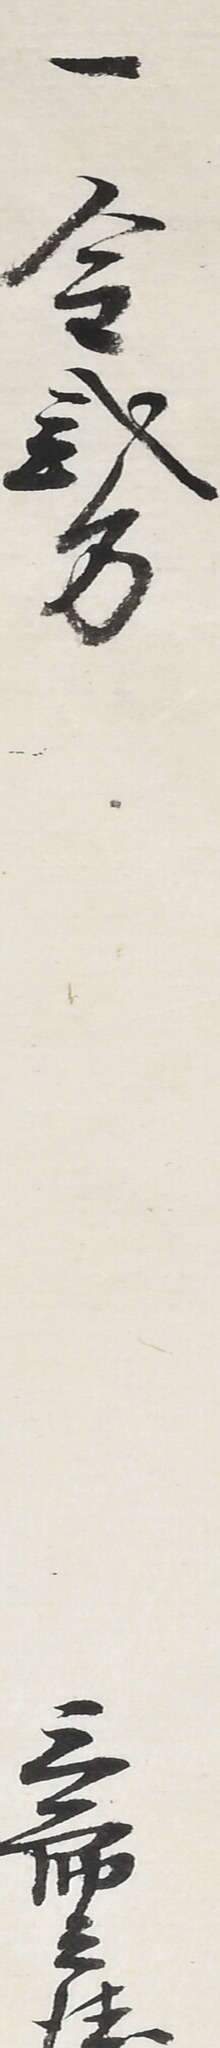一金弐分三郎兵衛
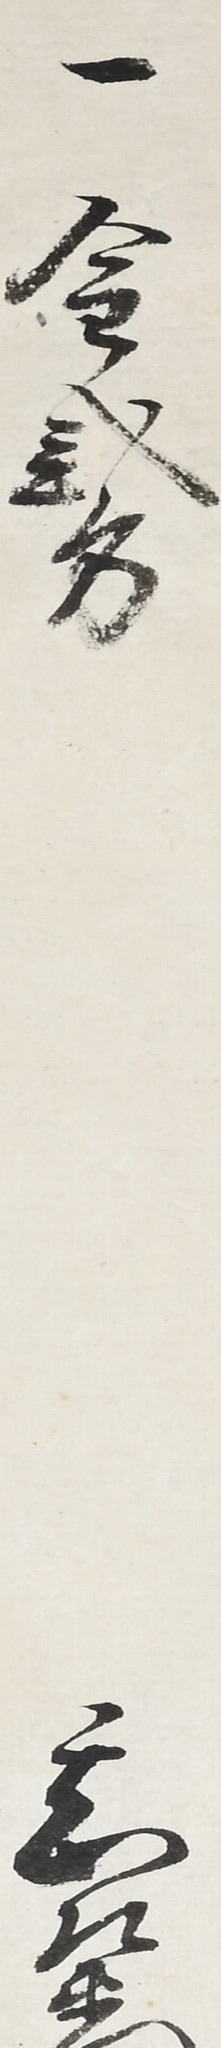一金弐分甚左衛門
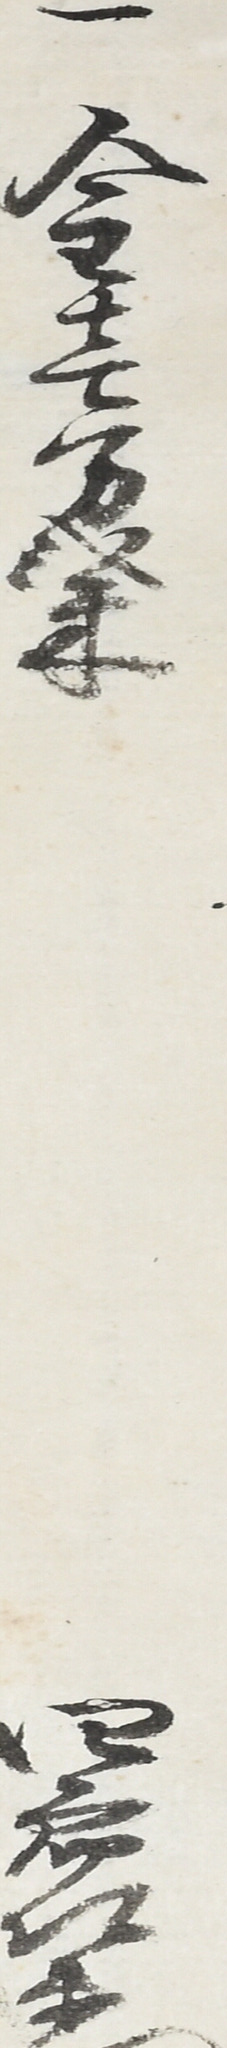一金壱分弐朱四郎左衛門

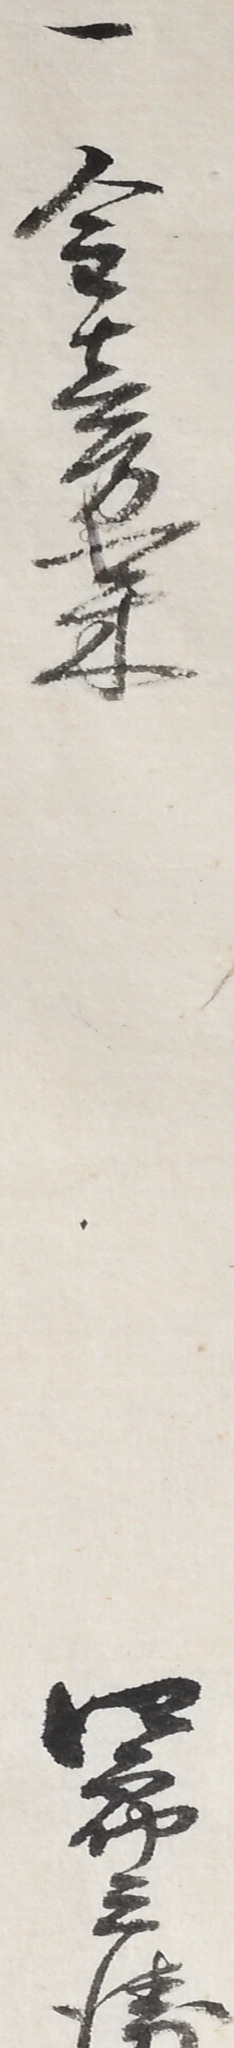一金壱分五朱四郎兵衛
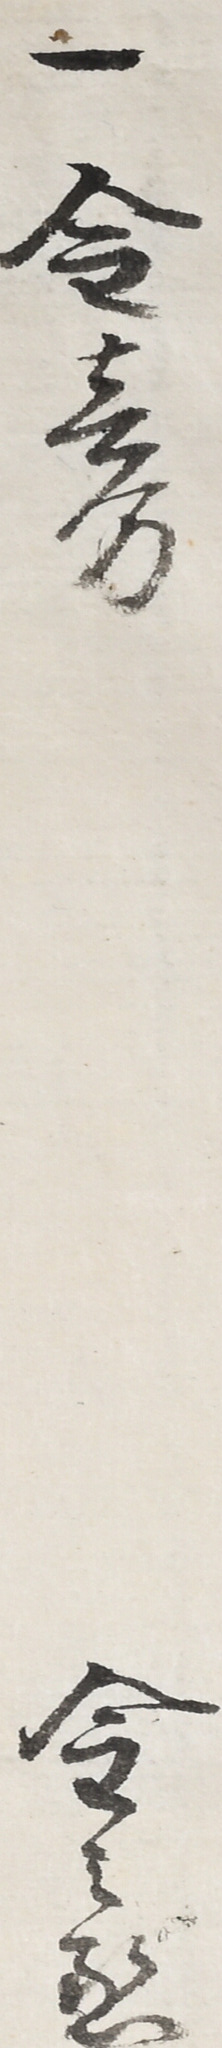一金壱分金之丞
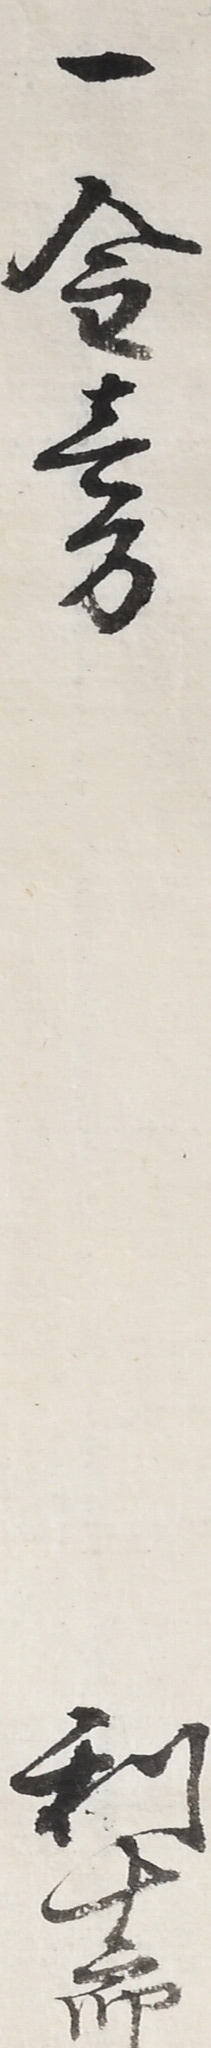一金壱分利十郎
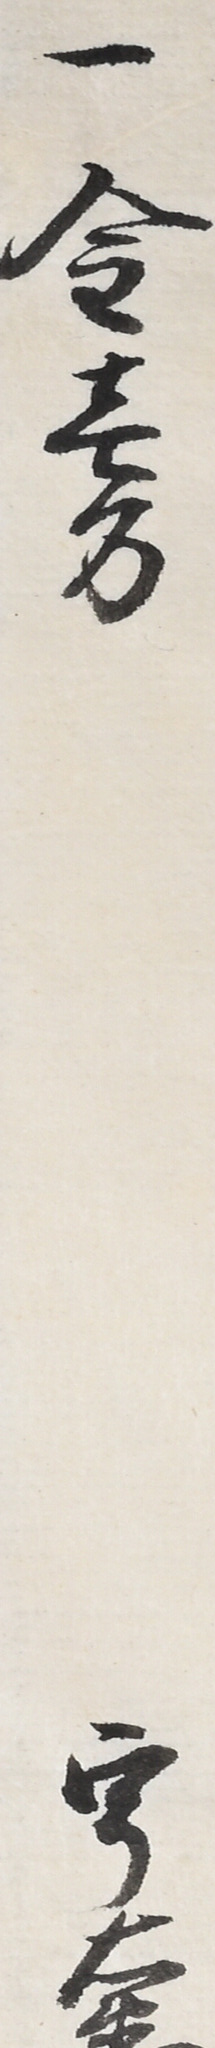一金壱分宇右衛門
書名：御拝地百五拾年御祝儀献上御目録名前
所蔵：伊那市立高遠町図書館・合同会社AMANE
